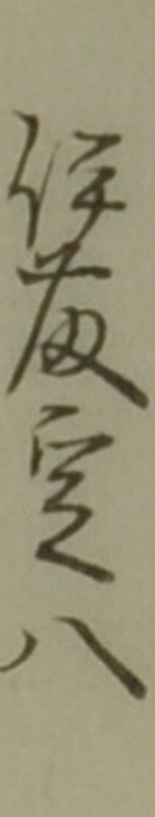伊藤定八
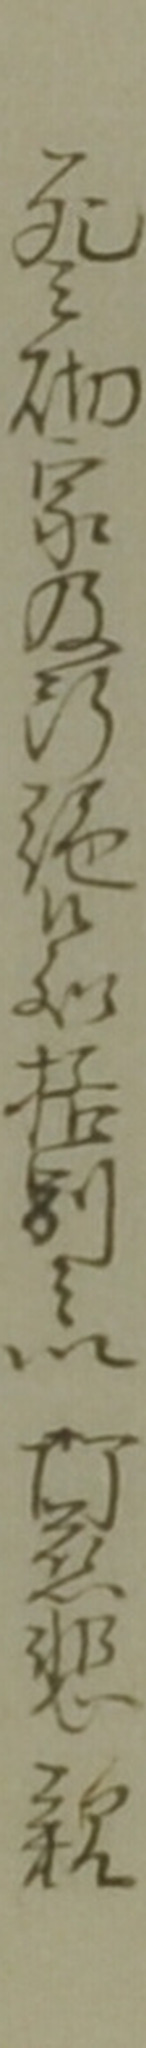死之砌家及断絶候処格別之以御慈悲親
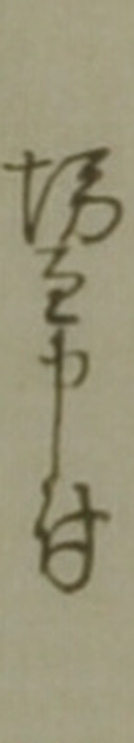坊主申付
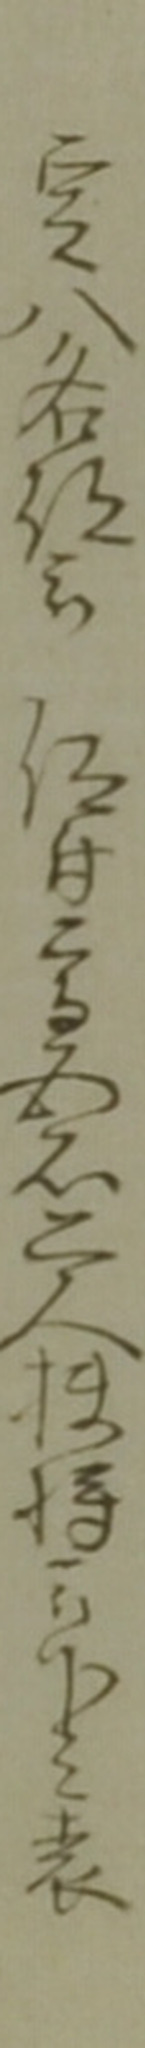定八名跡被仰付高五石二人扶持被下之表
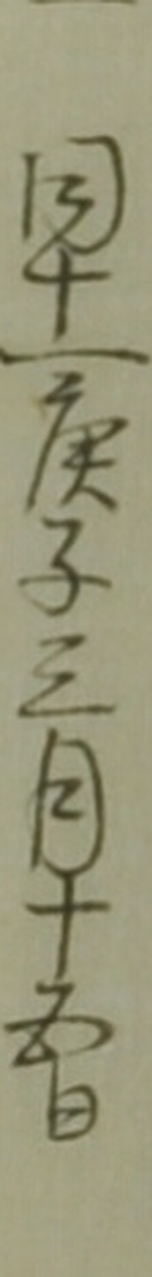一同十一庚子三月十五日
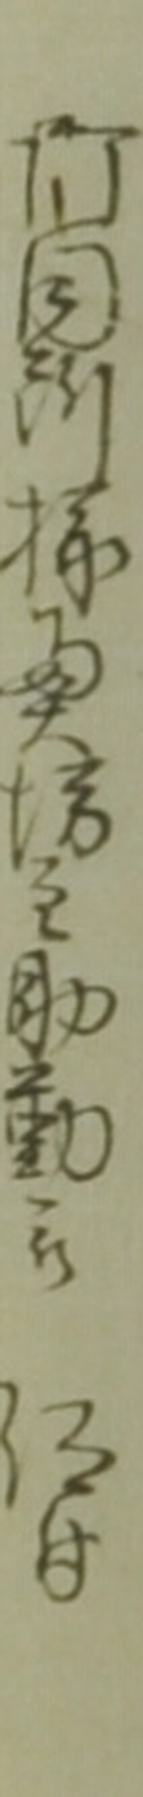御同所様奥坊主助勤被仰付

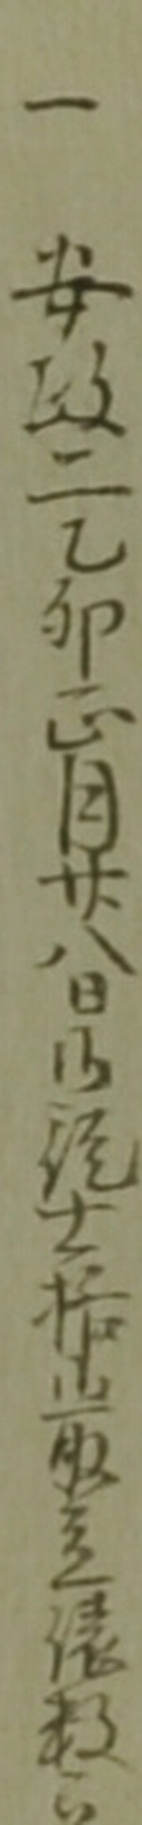一安政二乙卯正月廿八日御徒士格御取立俵数被成下
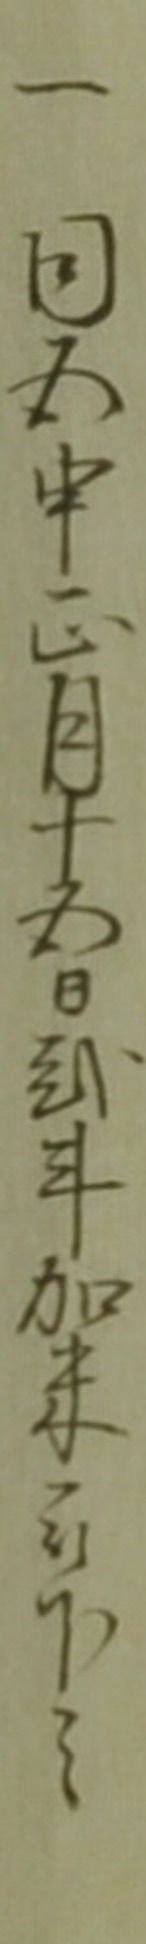一同五申正月十五日弐斗加米被下之
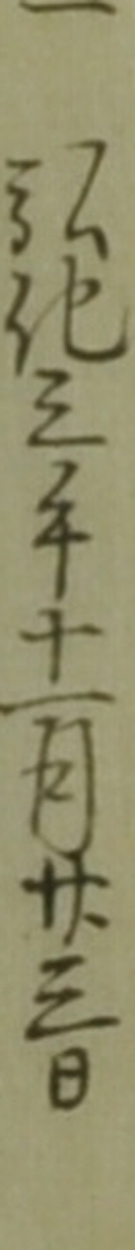一弘化三午十一月廿三日

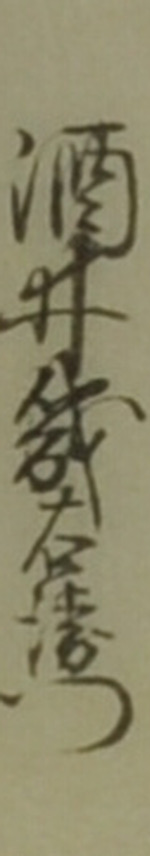酒井幾右衛門

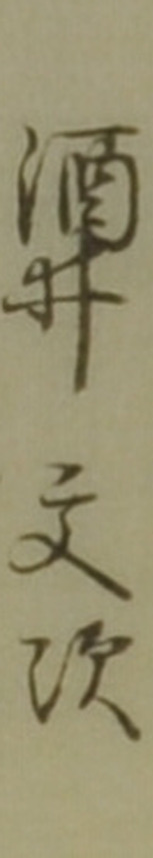酒井文次
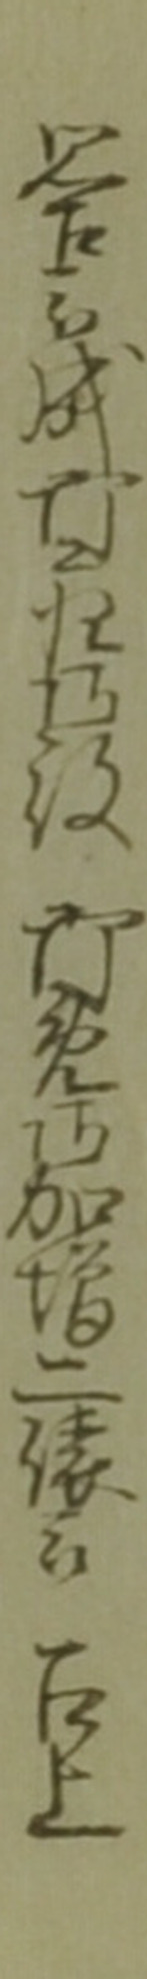思召被成御座御役御免御加増二俵被召上
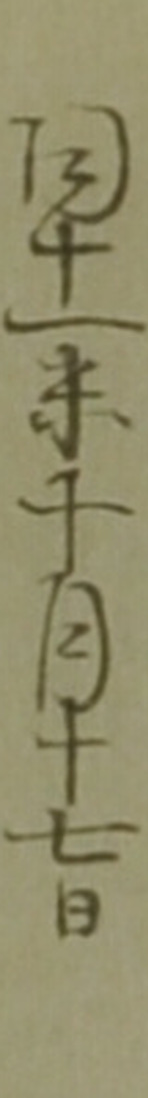一同十一未十月十七日
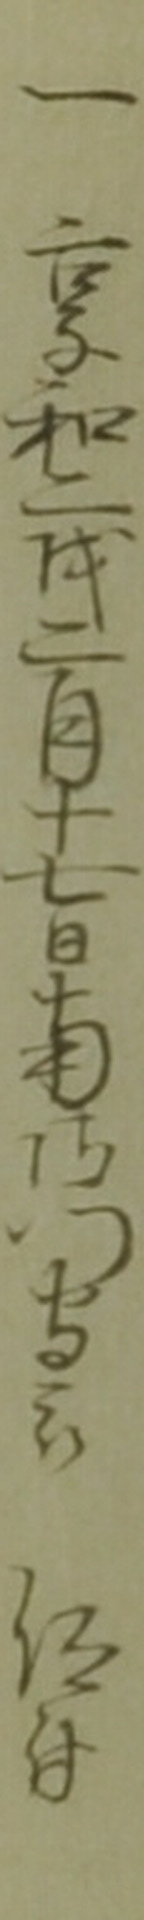一享和二戌二月十七日南御門守被仰付
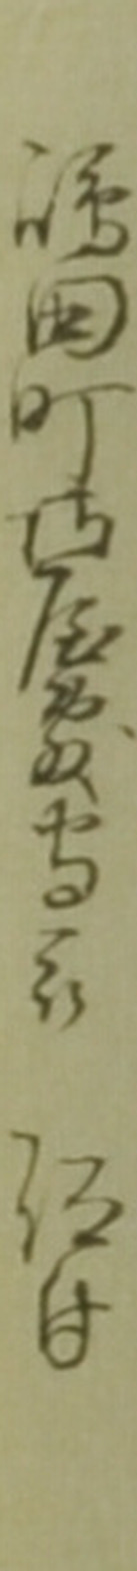嶋田町御屋敷守被仰付
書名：無足諸士勤仕録（九）
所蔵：伊那市立高遠町図書館・合同会社AMANE
